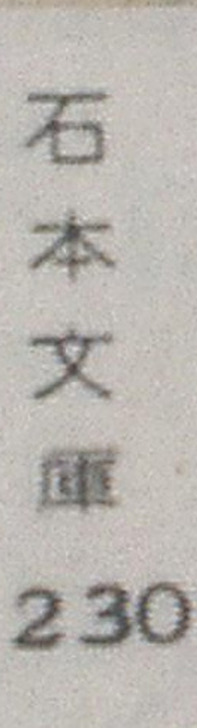石本文庫

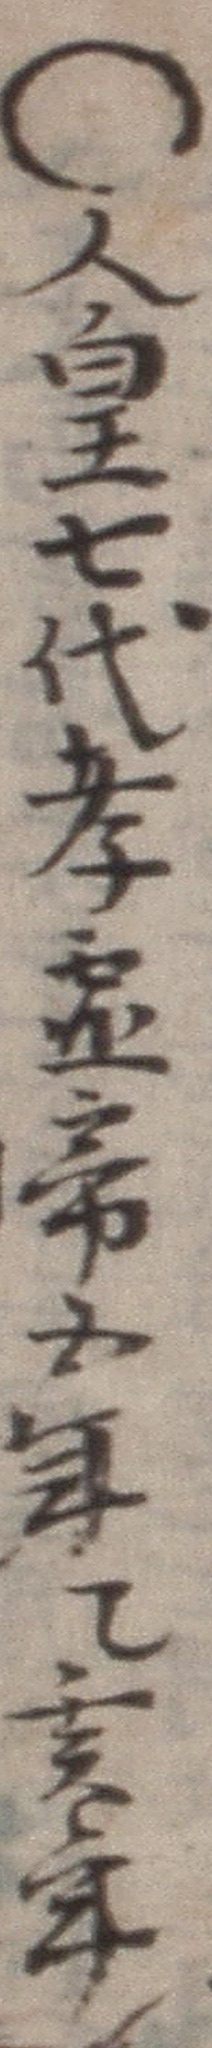○人皇七代孝霊帝五年乙亥年
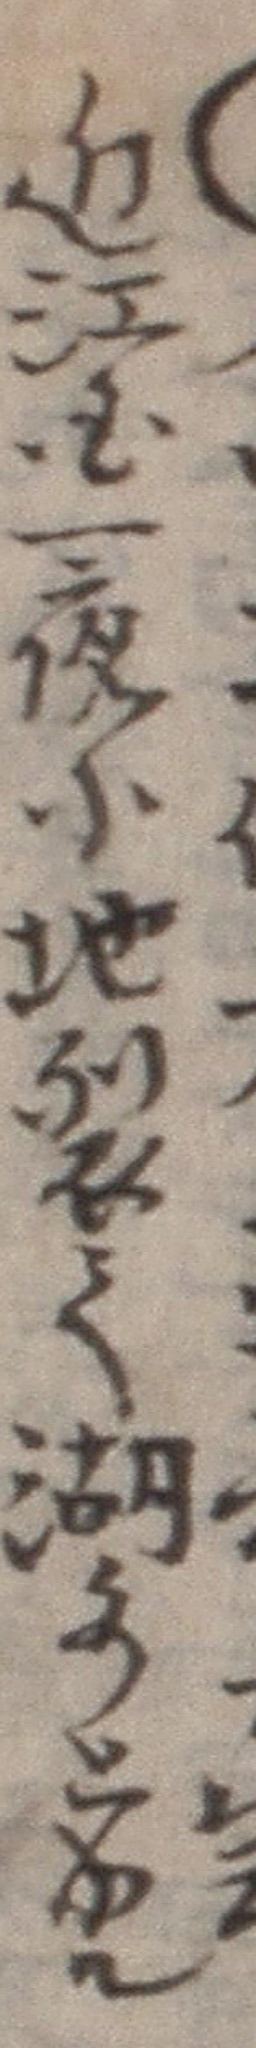近江国一夜に地裂て湖水となる
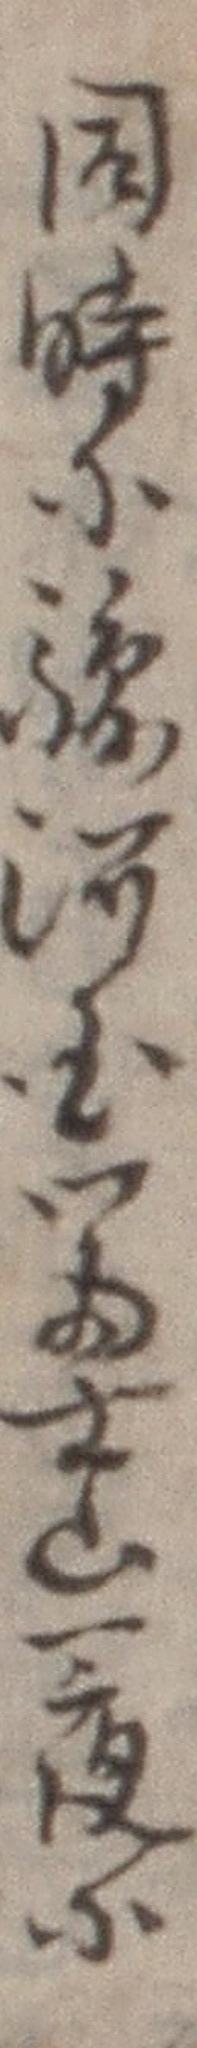同時に駿河国富士山一夜に
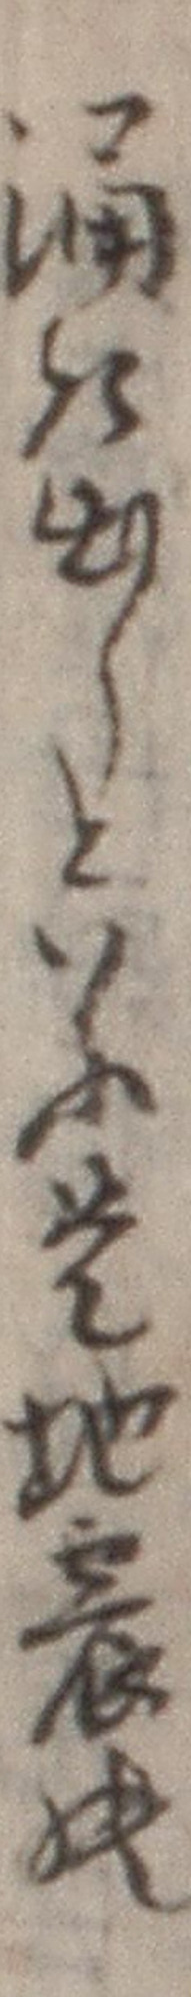涌き出しといふ是地震の
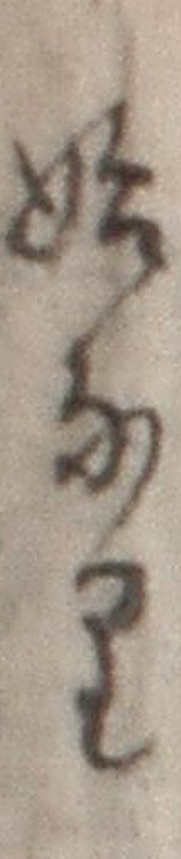始なり
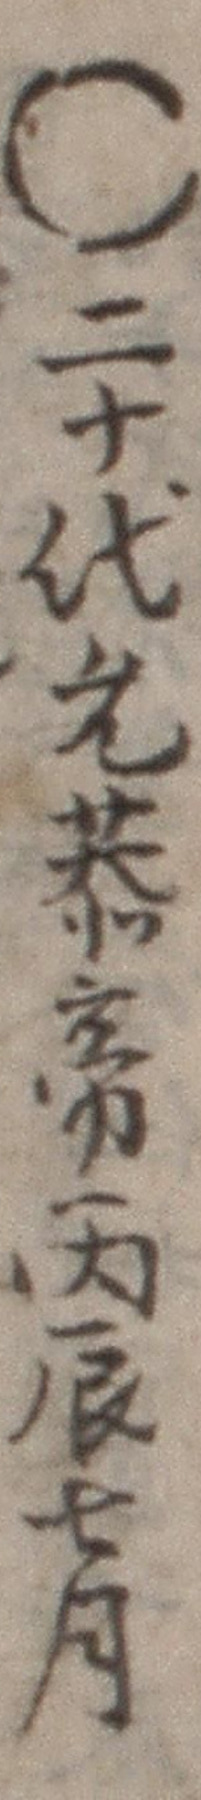○二十代允恭帝丙辰七月
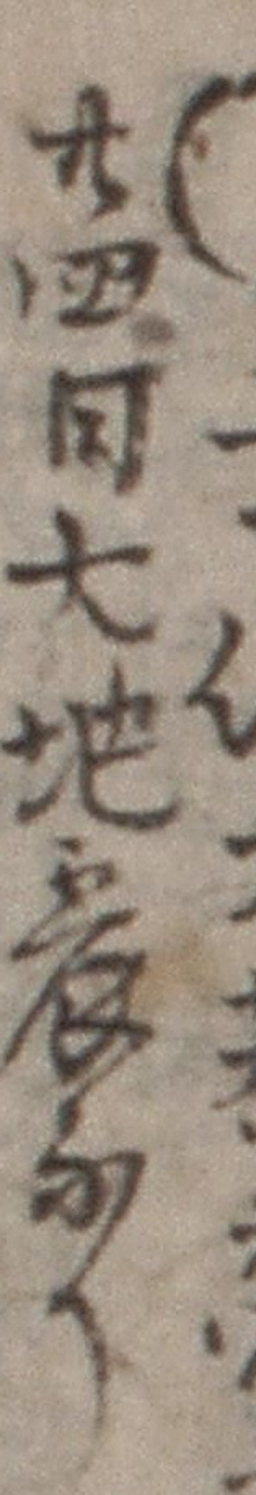廿四日大地震なり
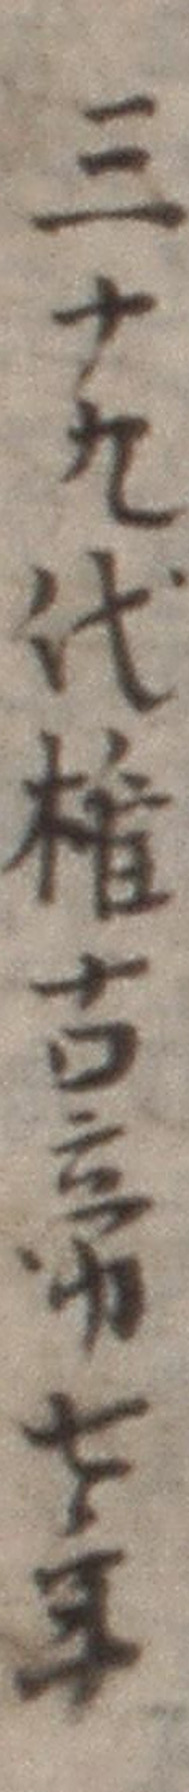三十九代推古帝七年
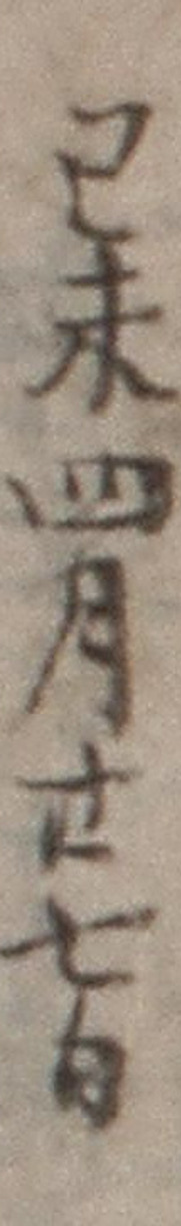巳未四月廿七日
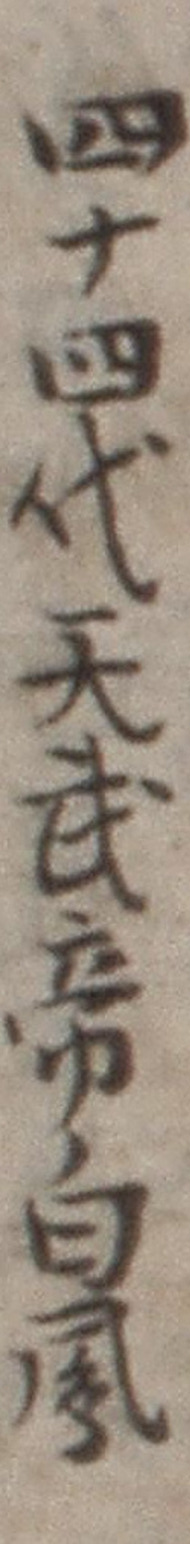四十四代天武帝白鳳
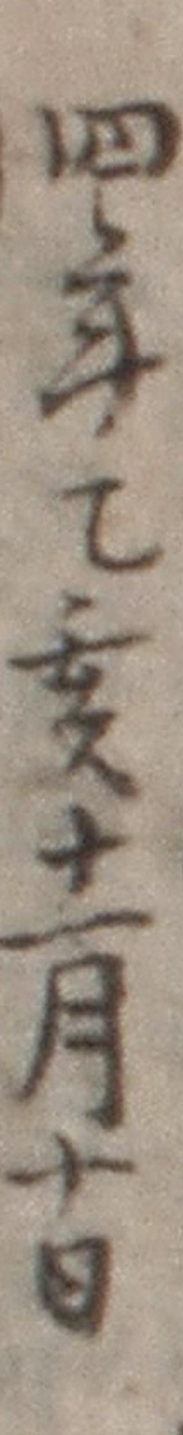四年乙亥十一月十日
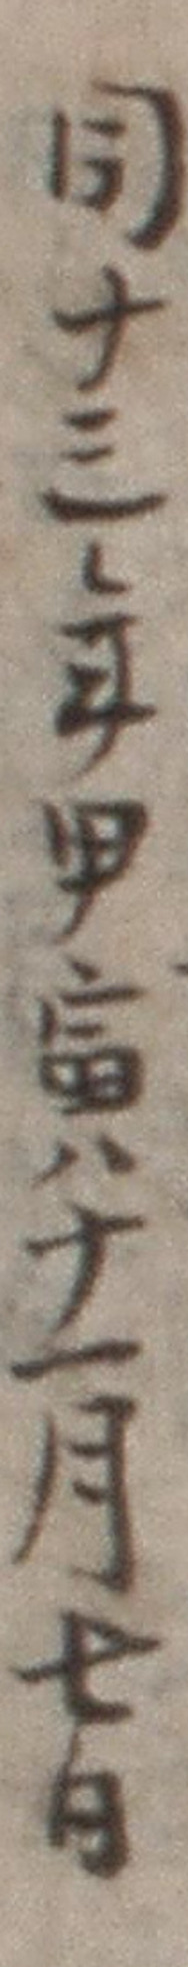同十三年甲寅十一月七日
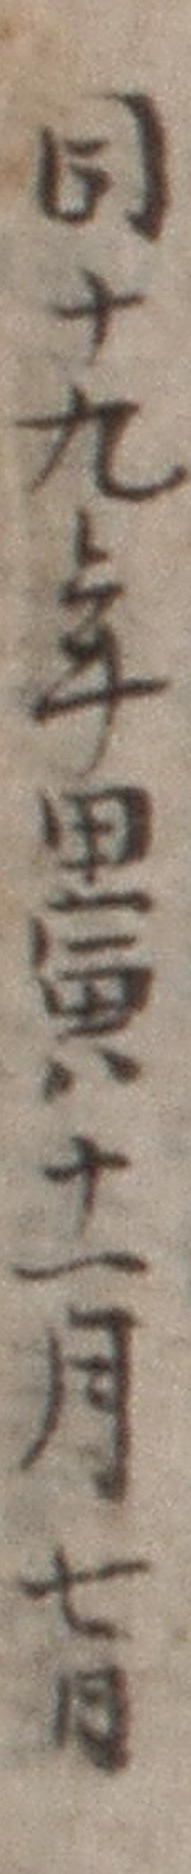同十九年甲寅十一月七日

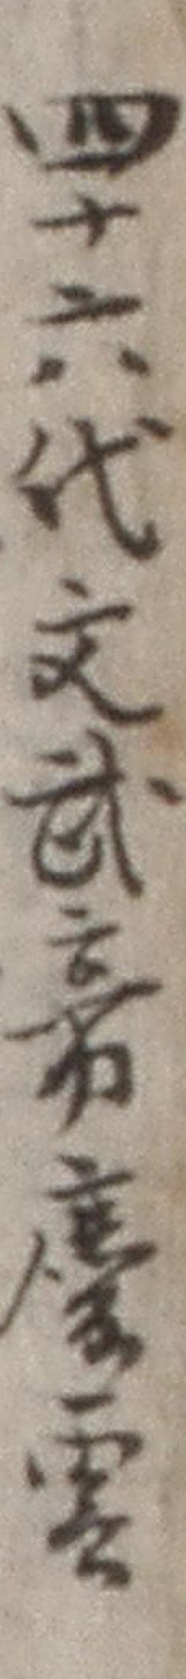四十六代文武帝慶雲
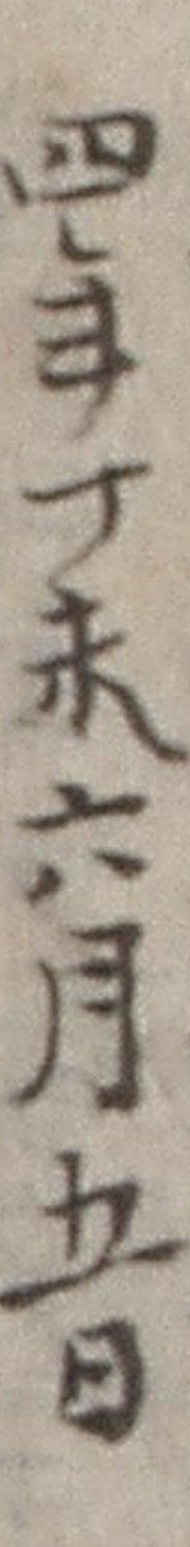四年丁未六月五日
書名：諸國大地震年代記末代噺種
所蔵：東京大学地震研究所図書室 Earthquake Research Institute Library, The University of Tokyo, JAPAN
